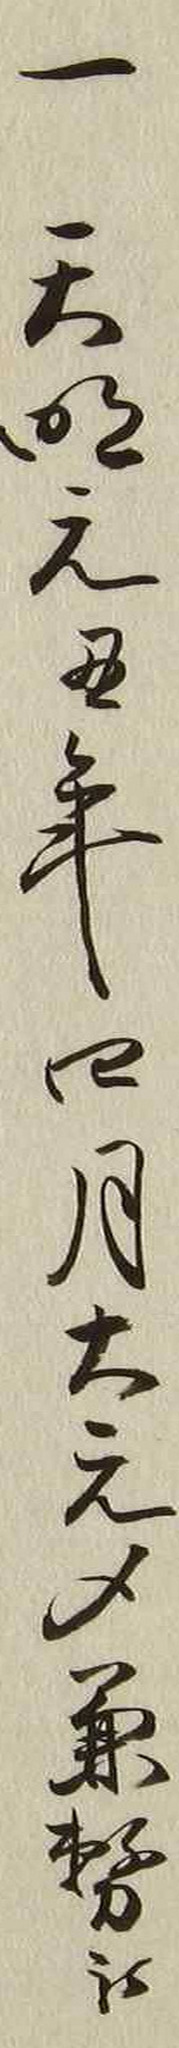一天明元丑年四月大元〆兼務被
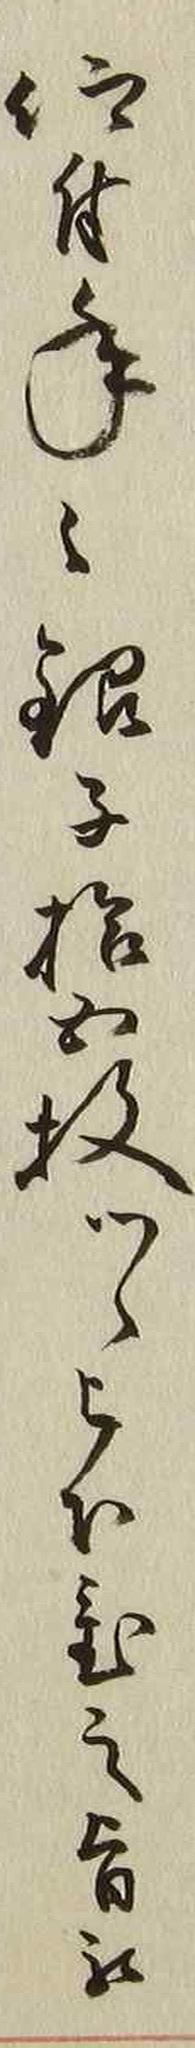仰付年々銀子拾五枚ツヽ被下置之旨被
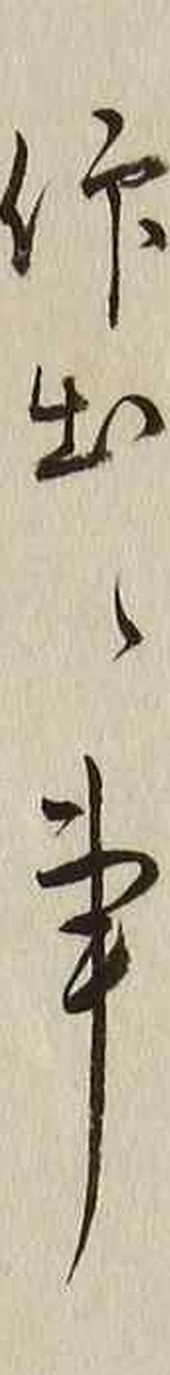仰出候事
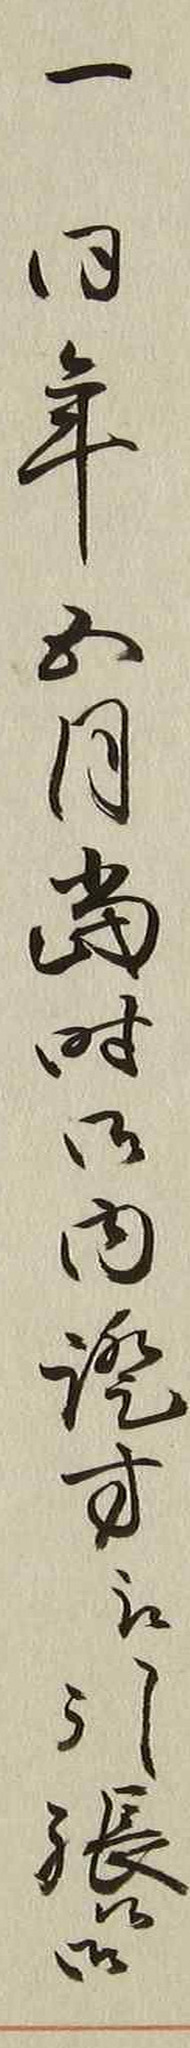一同年五月当時御内証方江引張候御
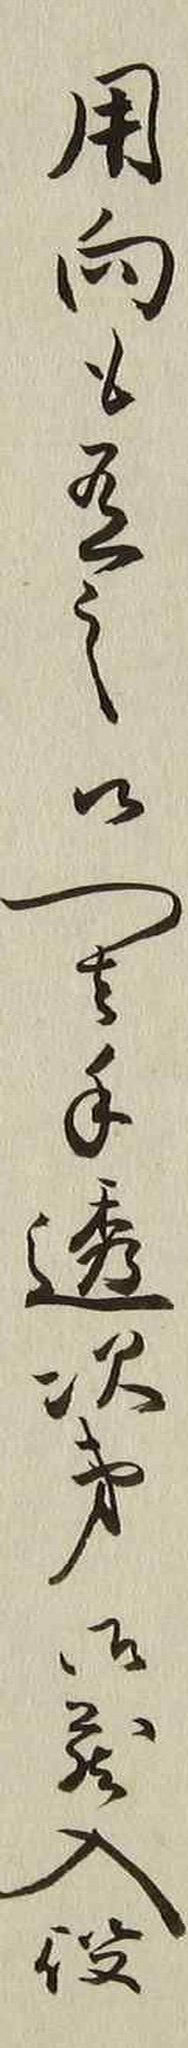用向も有之候へ者手透次第御蔵入役
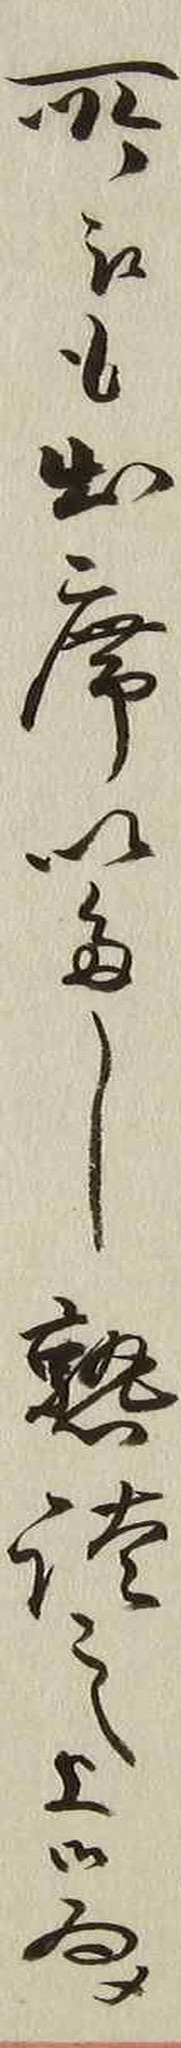所江も出席いたし熟談之上御為〆
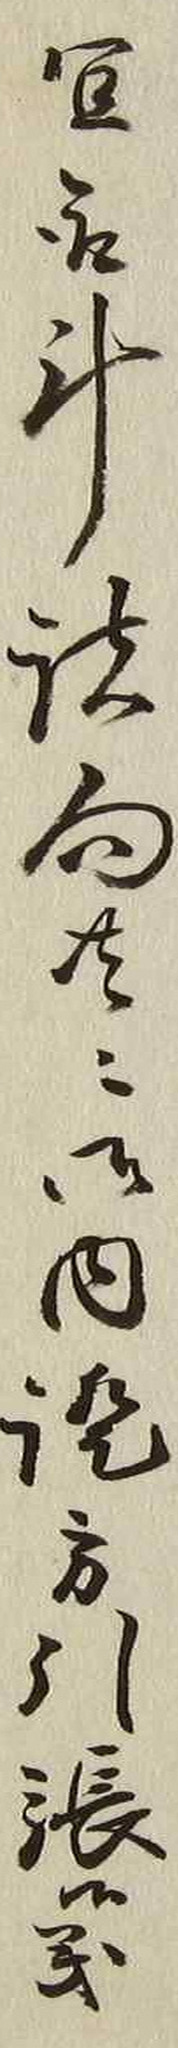宜取計諸向共ニ御内証方引張候義
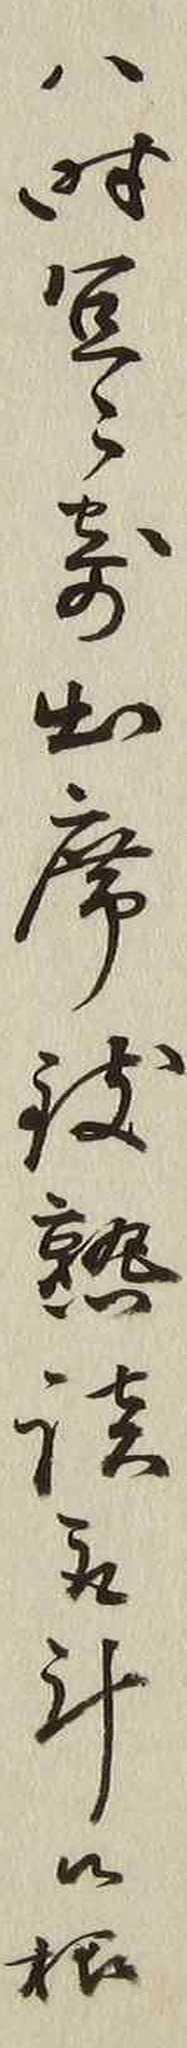ハ時宜ニ寄出席致熟談取計侯様
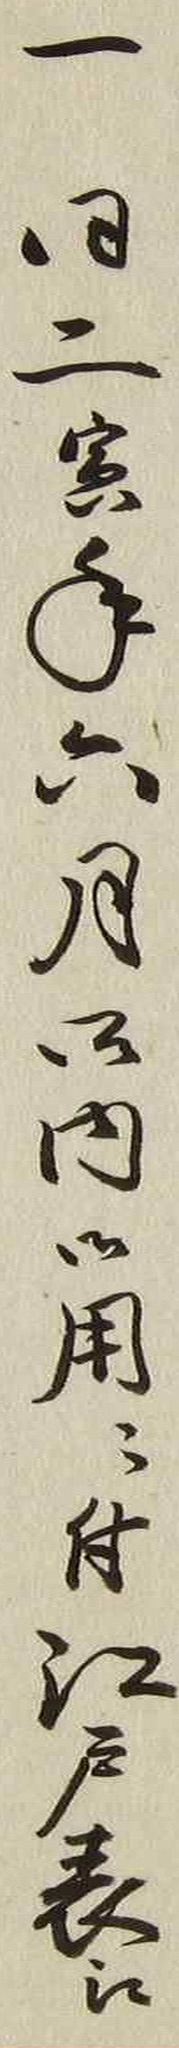一同二寅年六月御内御用ニ付江戸表江
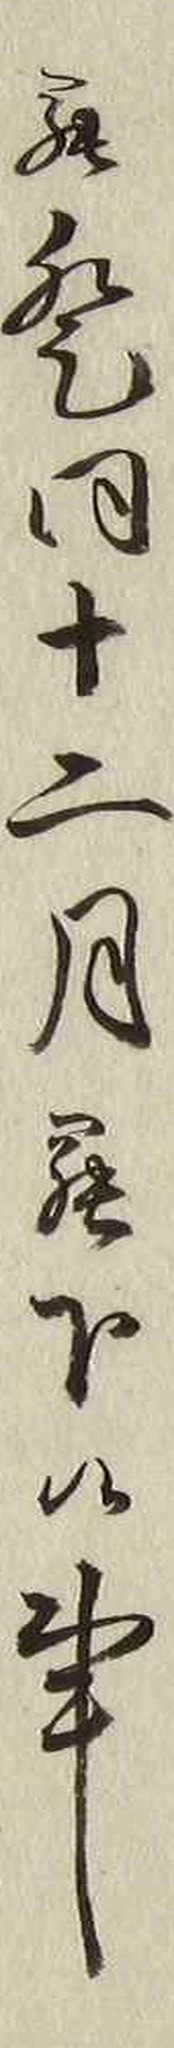罷登同十二月罷下候事
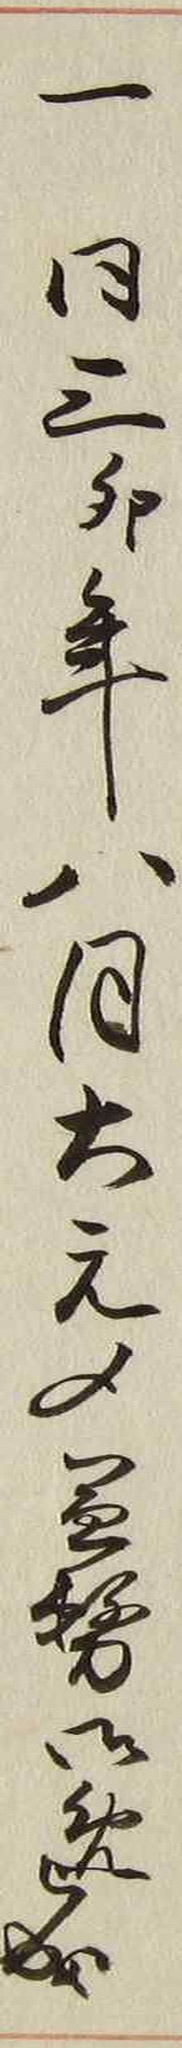一同三卯年八月大元〆兼務御免被成
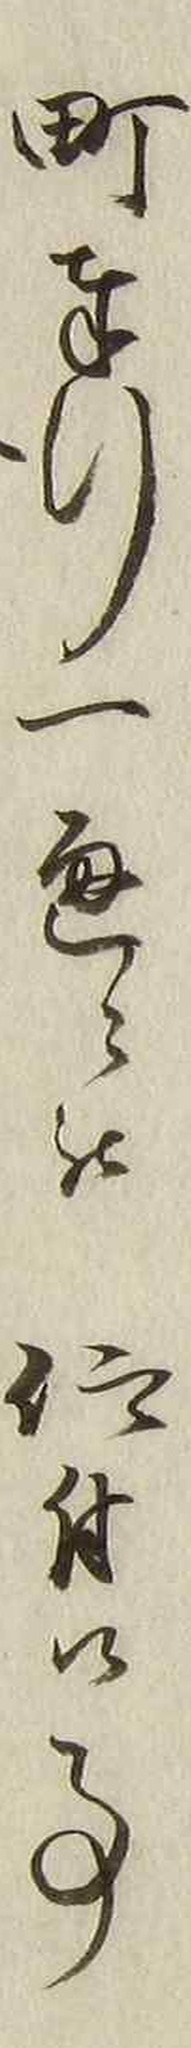町奉行一通ニ被仰付候事
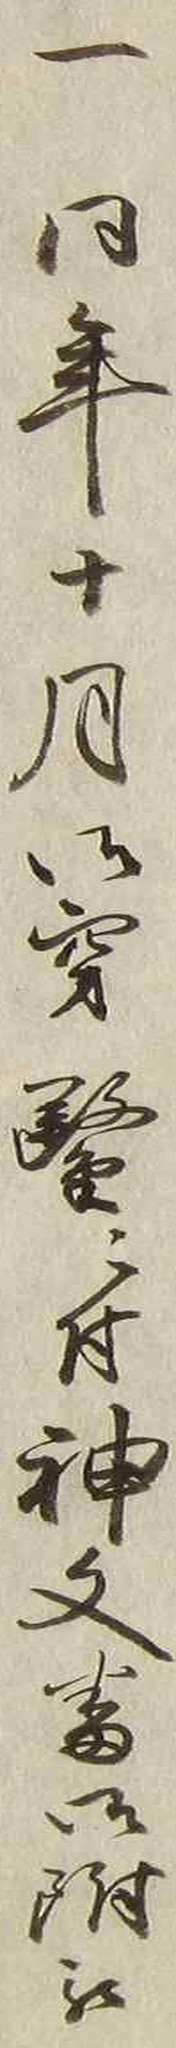一同年十月御穿鑿ニ付神文番御附被

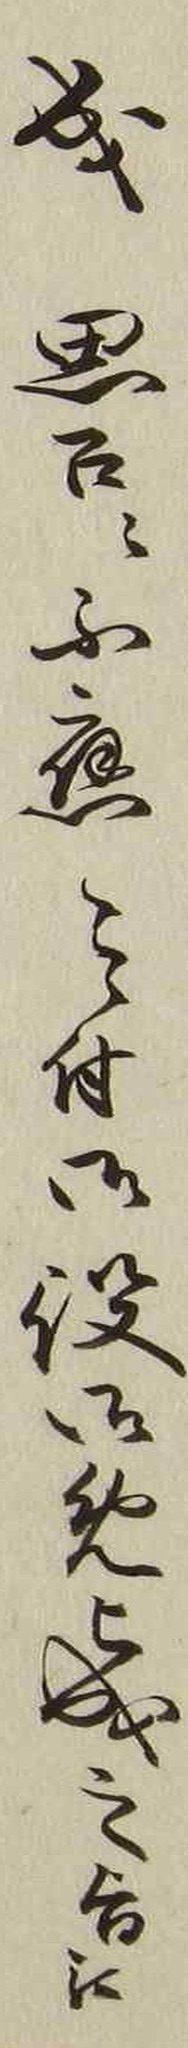成思召ニ不応候ニ付御役御免被成之旨被
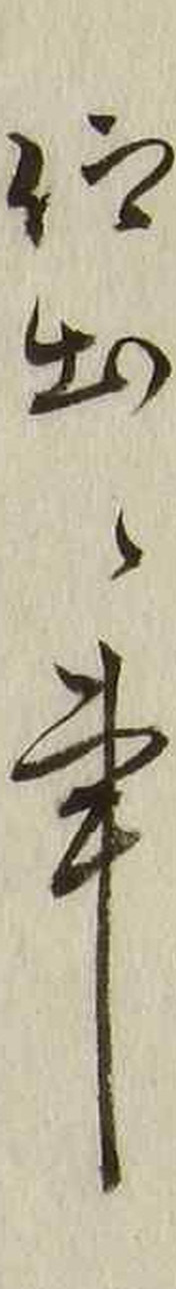仰出候事
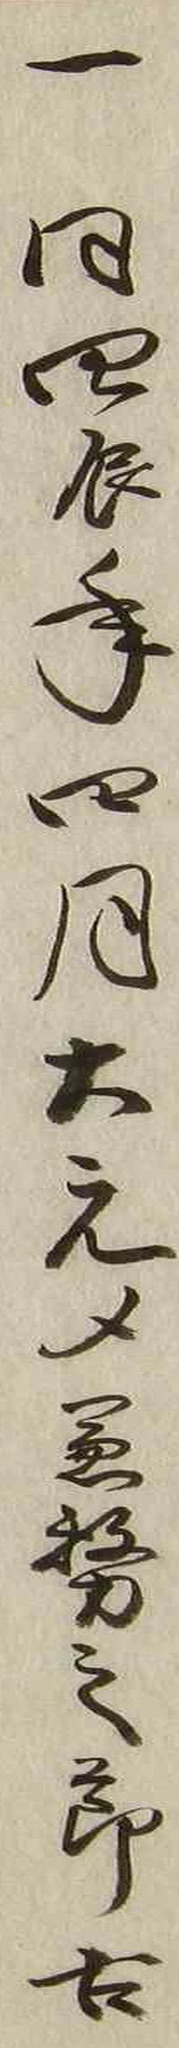一同四辰年四月大元〆兼務之節古
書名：諸士系譜　巻之15　い之部15
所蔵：会津若松市立会津図書館
